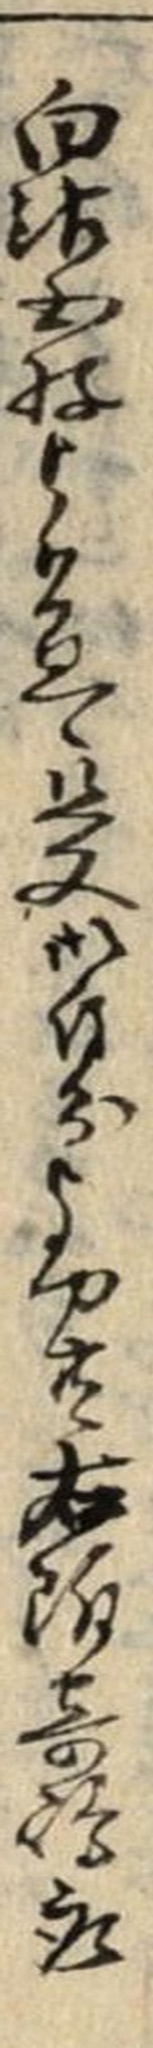白銀五枚被下置候且又御自分与力共へ右附寄嶋取
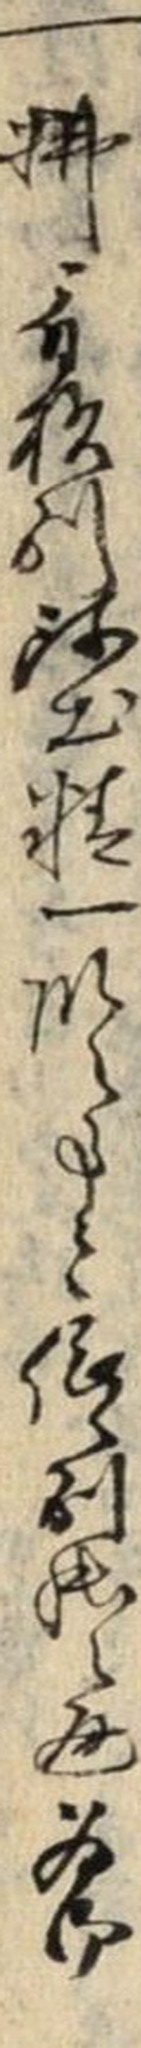払候に付格別致出精一段之事に候依之別紙之通為御
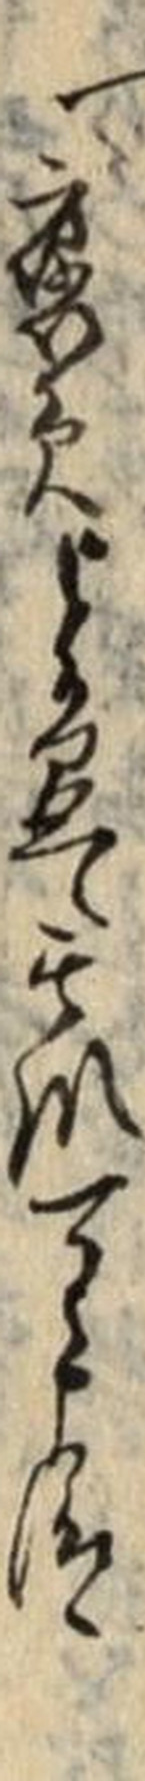褒美被下置候其段可被申渡候
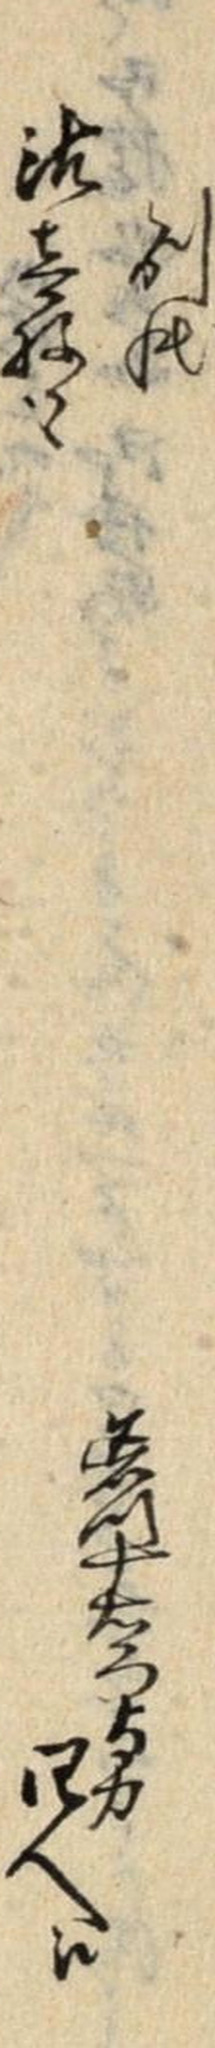銀壱枚ツヽ荒川十右衛門与力
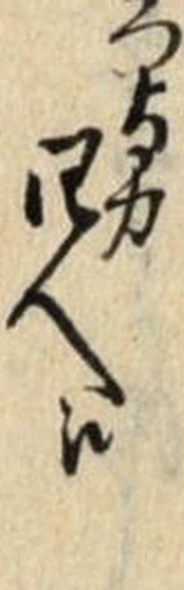四人江
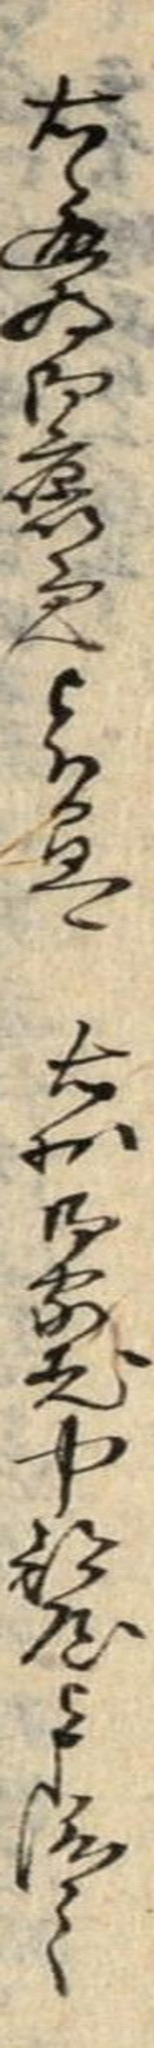右之通為御褒美被下置候右於御家老中部屋被申渡之
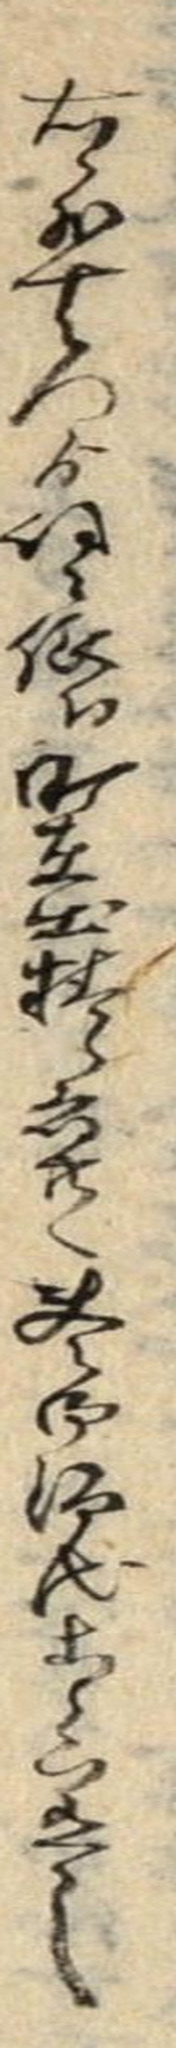右之外十右衛門ゟ伺に依而町在出精之者共へ夫々御酒代等被下有之
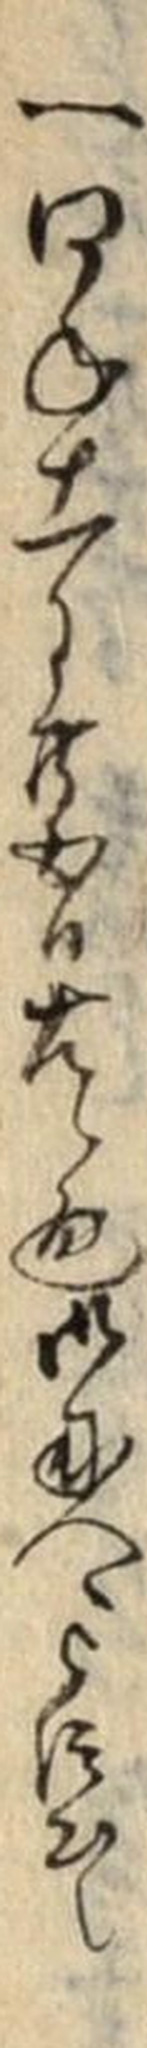一同年十一月廿五日左之通御用人へ被仰出之
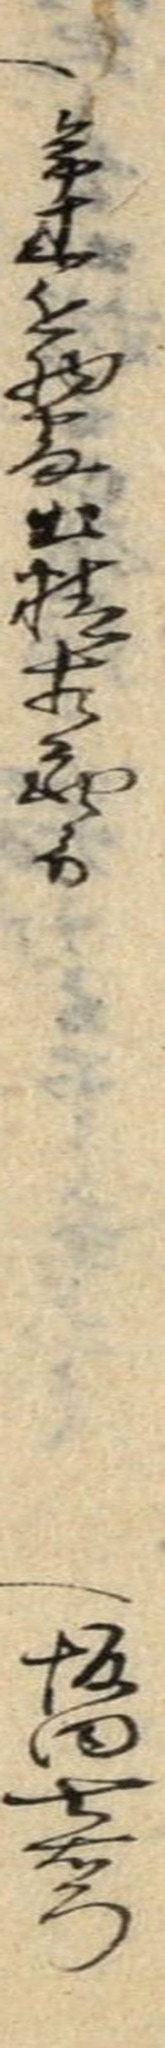年来進物番出精相勤候に付坂田七右衛門
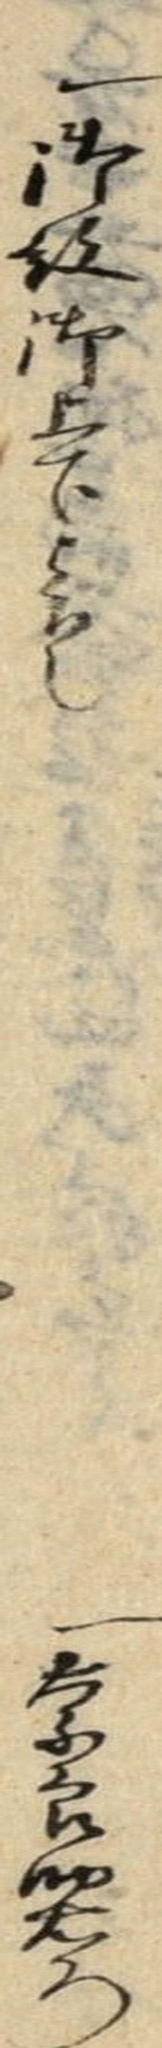御紋御上下被下之奈良助右衛門

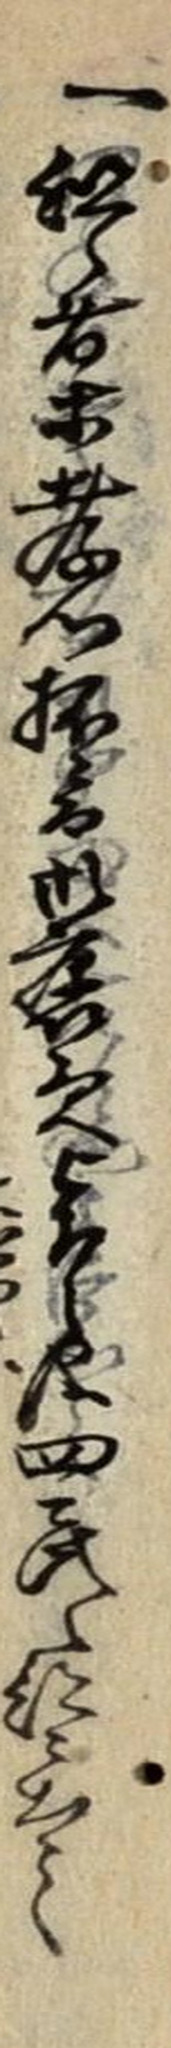一組之者等孝心抔に而御褒美被下候儀四民之部に出之
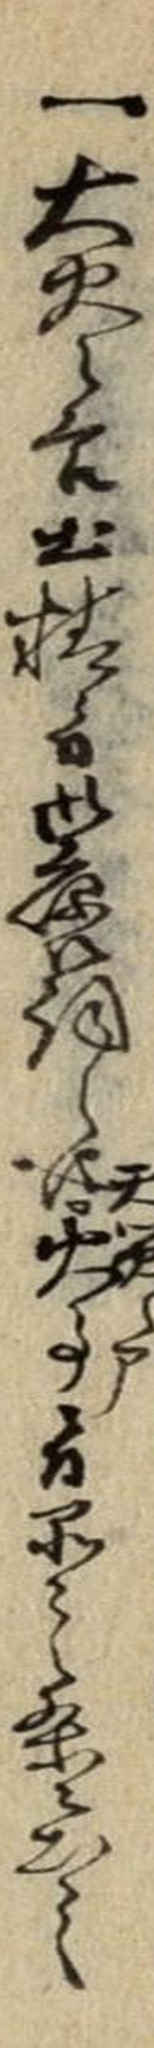一大火之節出精に付御褒詞之儀天災之部火事に付品々之条に出之
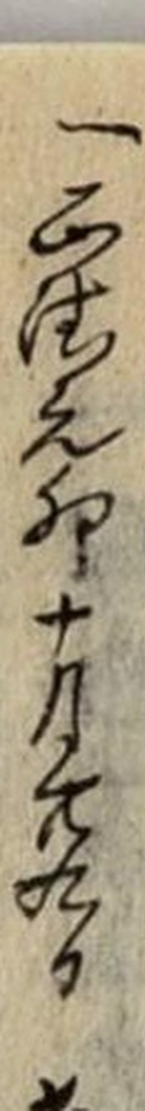一正徳元卯十月廿九日
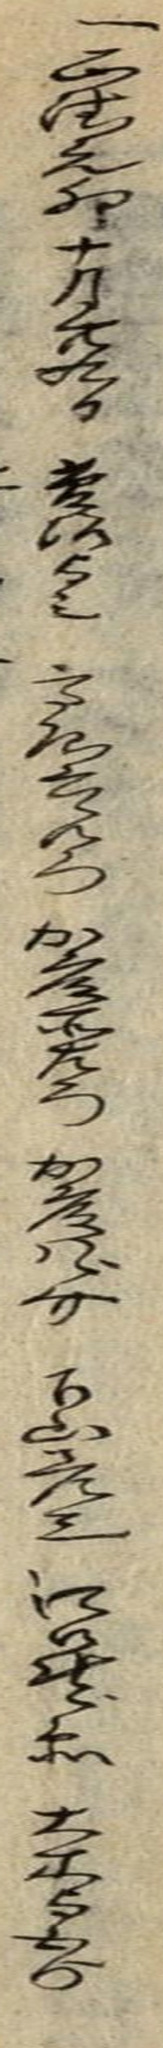菅沼与三高屋六郎左衛門加藤所左衛門加藤八郎介下山彦三江口次郎兵衛大木与五右衛門
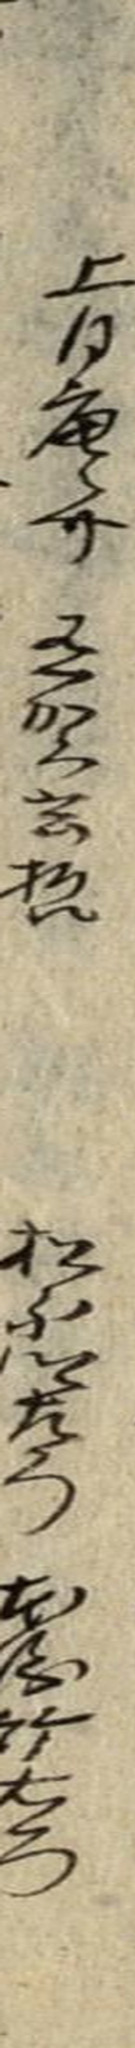上月唐之介有賀玄哲松永郷左衛門本儀竹右衛門
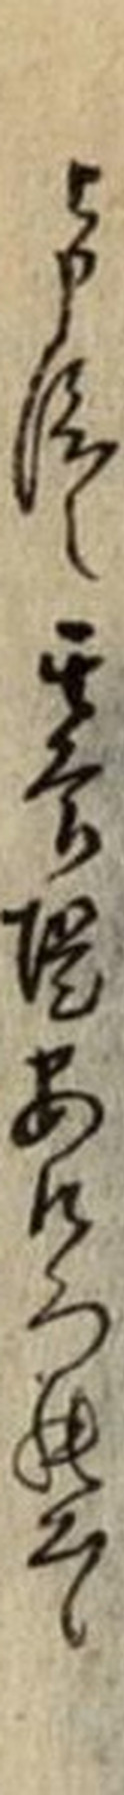被申渡之其節堤安左衛門罷出候
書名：御用并被仰出之部
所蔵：福井県文書館 Fukui Prefectural Archives
